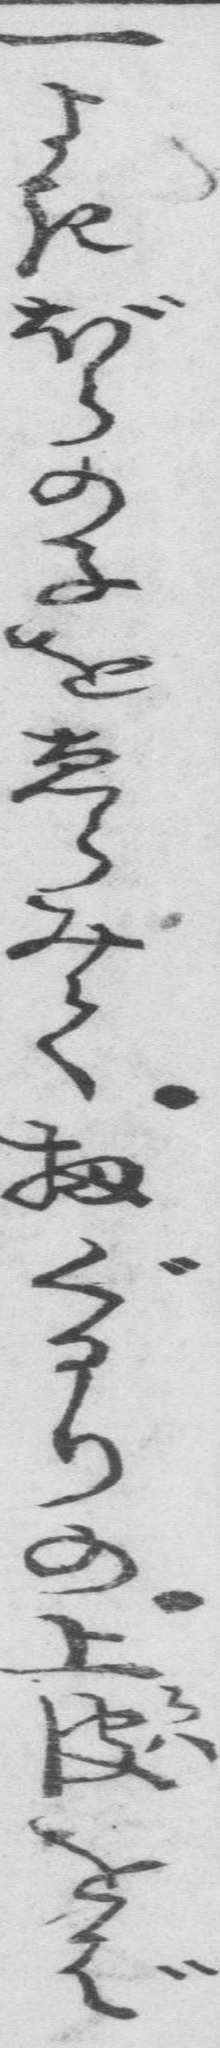一よきぼらの子をゑらみて。扨ぐるりの。上皮をば
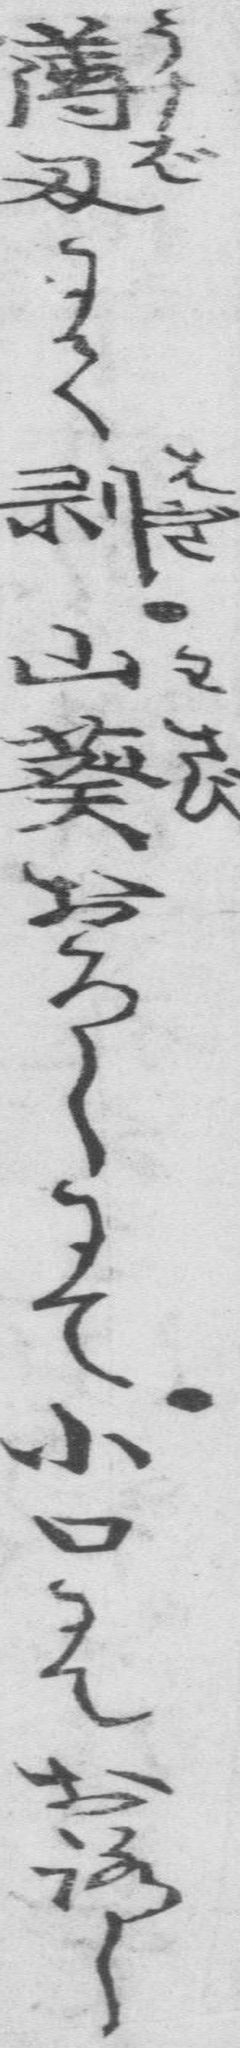薄刃にて剥。山葵おろしにて。小口にておろし
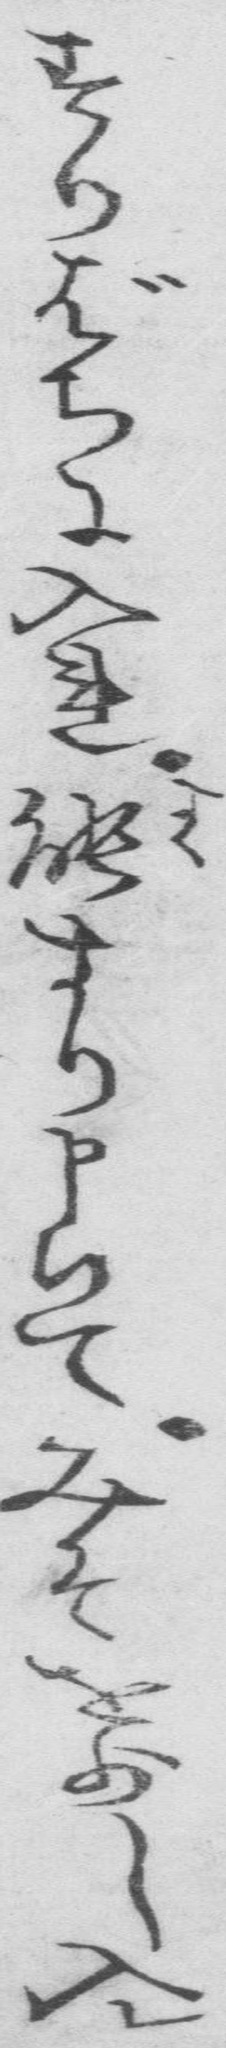すりばちに入れ。能すり申候て。みそを少し入れ
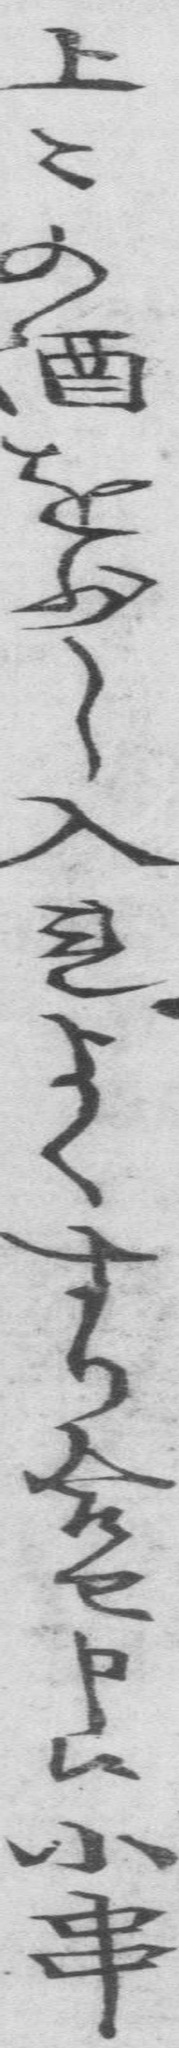上々の酒を少し入れ。よくすり合せ申候。小串

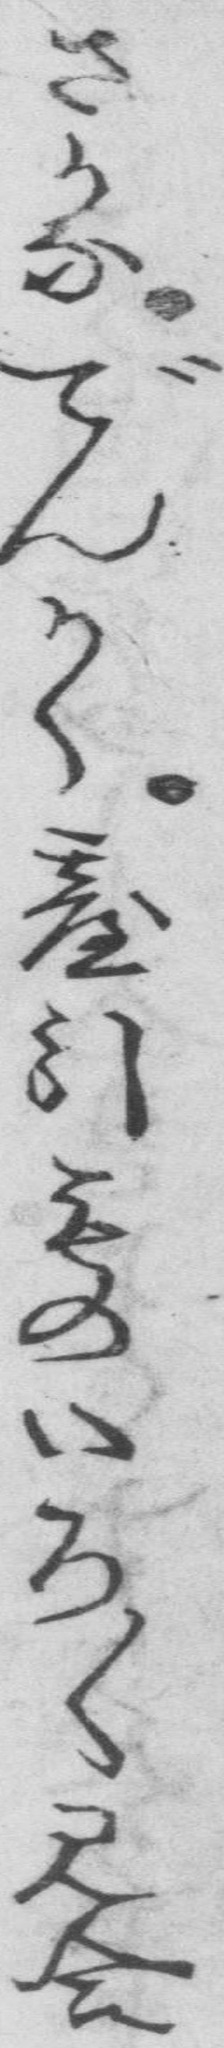さかな。でんかく。台引ものいろ〳〵見合
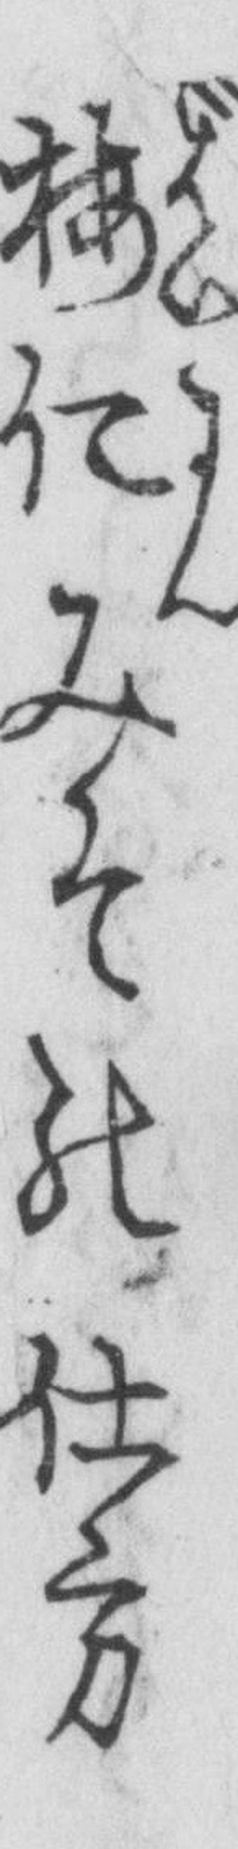梅仁みその仕方
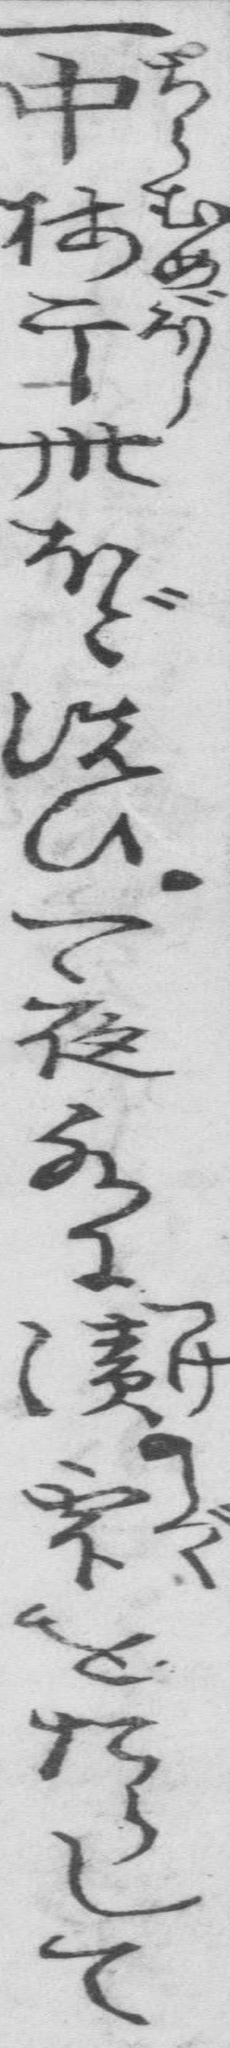一中梅干卅ほど洗ひ。一夜水に漬。雫をたらして
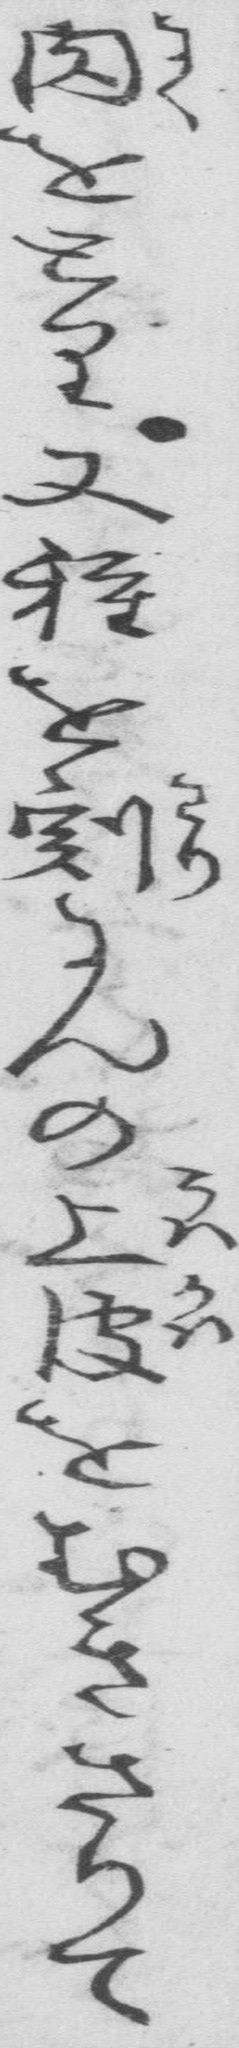肉をとり。又種を割にんの上皮をむきさりて
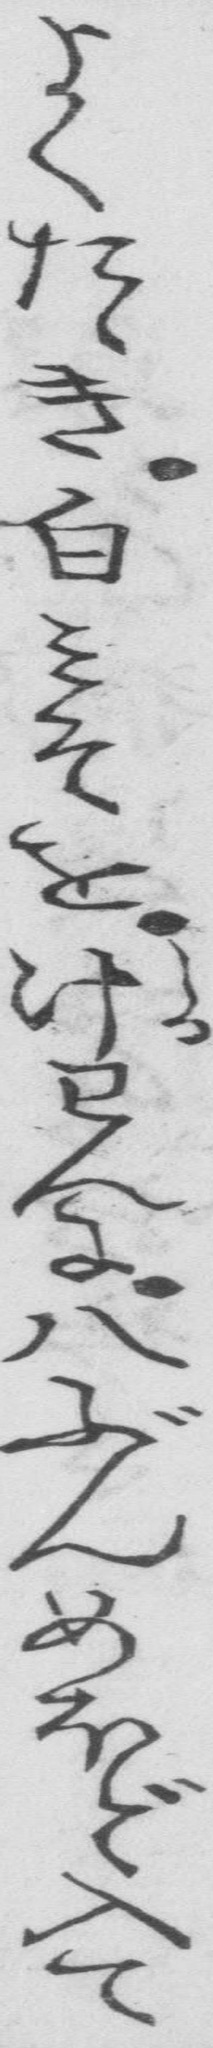よくたゝき。白みそを。汁わんに。八ぶんめほど入て
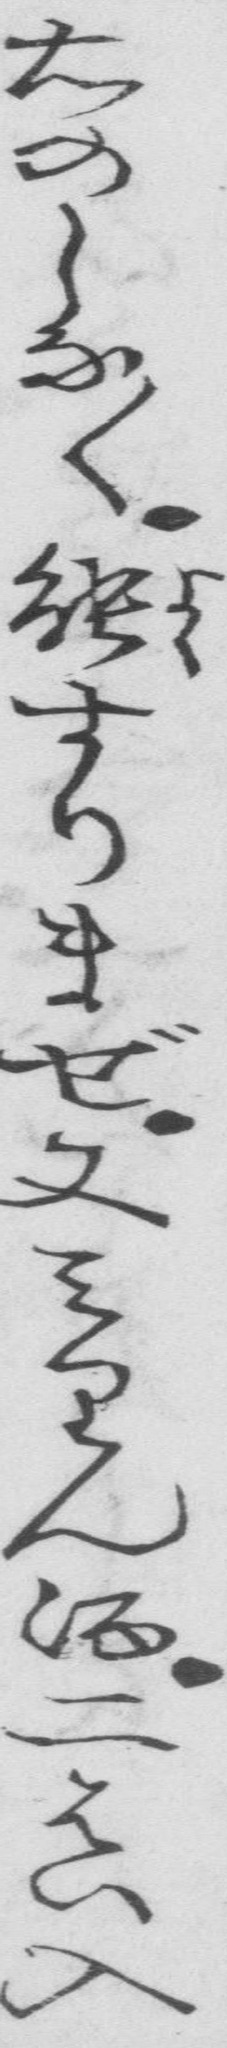右のしな〳〵。能すりまぜ。又みりん酒。二はい入
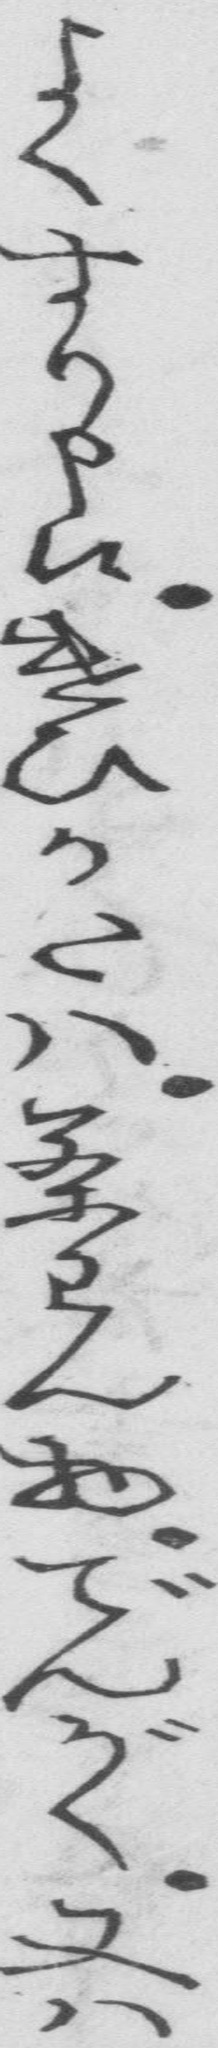よくすり申候。遣ひかたは。茶わん物。でんがく。又は
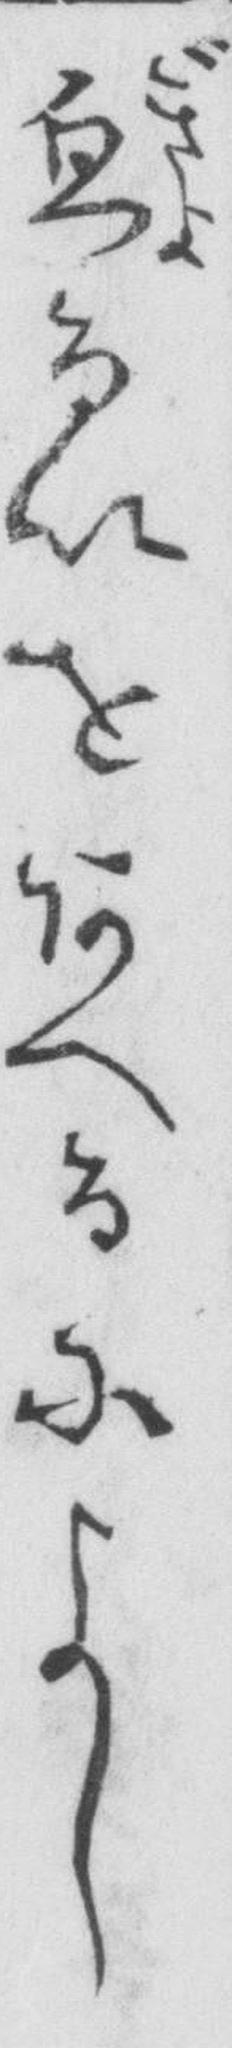魚るいをあへるによし
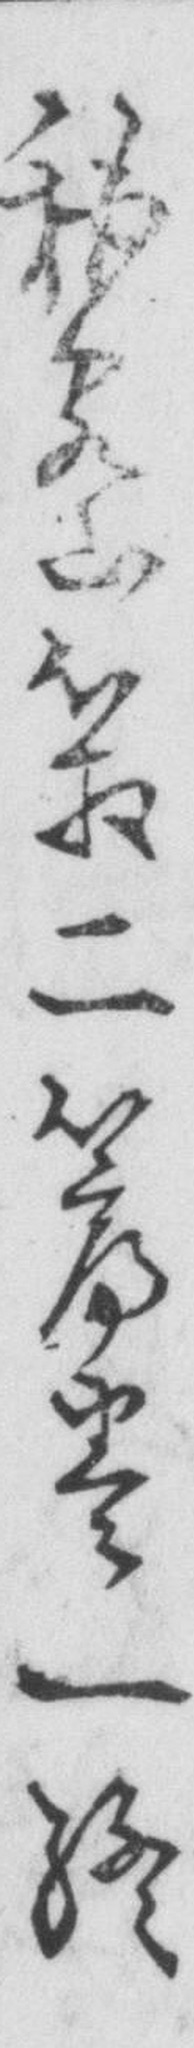秘密箱二篇巻一終

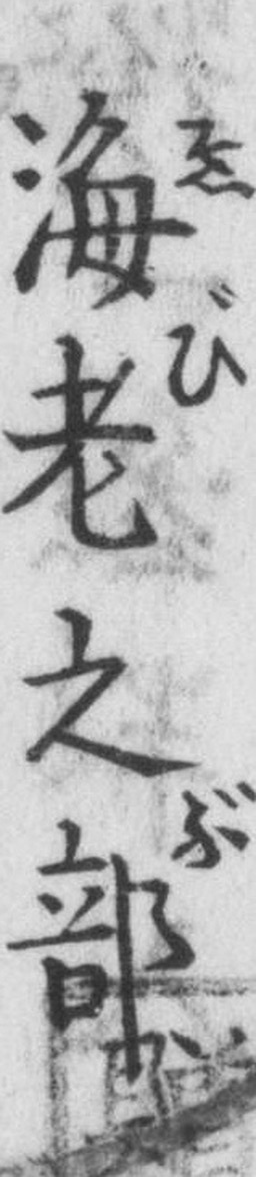海老之部
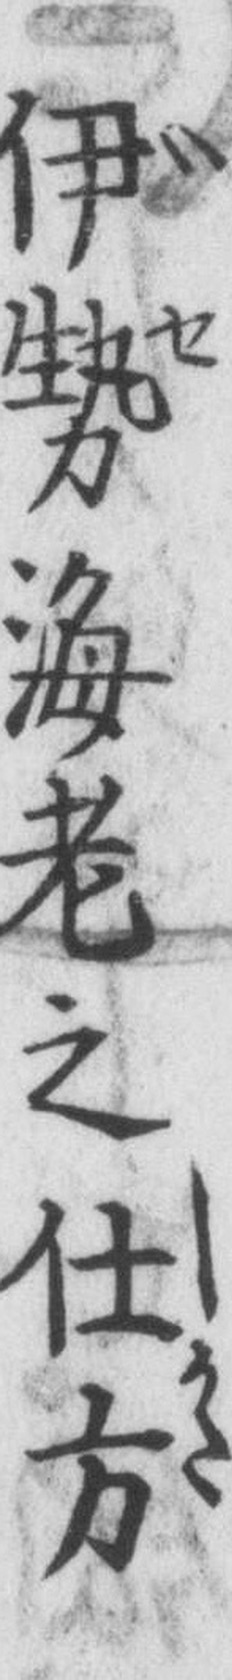伊勢海老之仕方
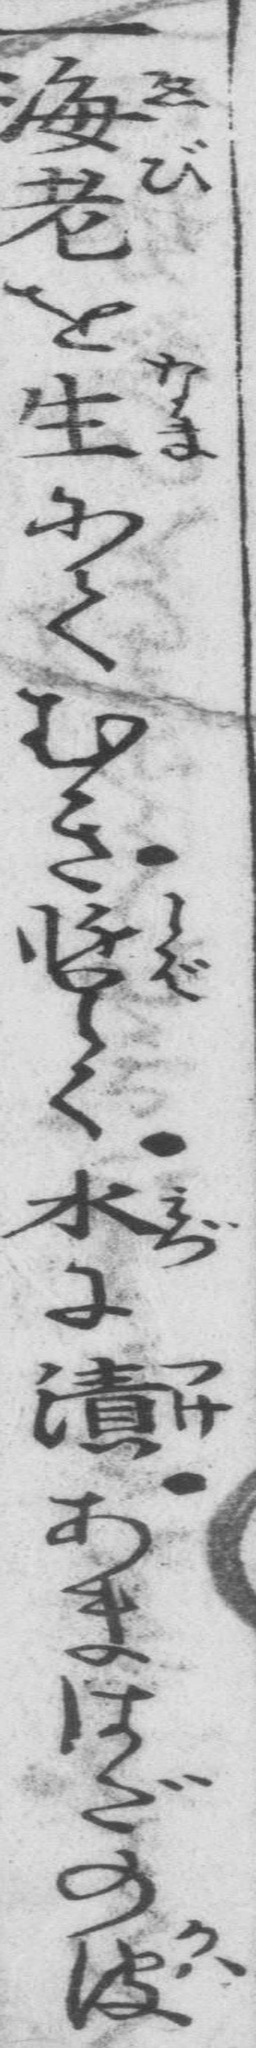一海老を生にてむき。暫らく。水に漬。あまはだの皮
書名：萬寳料理秘密箱
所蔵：大阪府立大学学術情報センター 国文学研究資料館
